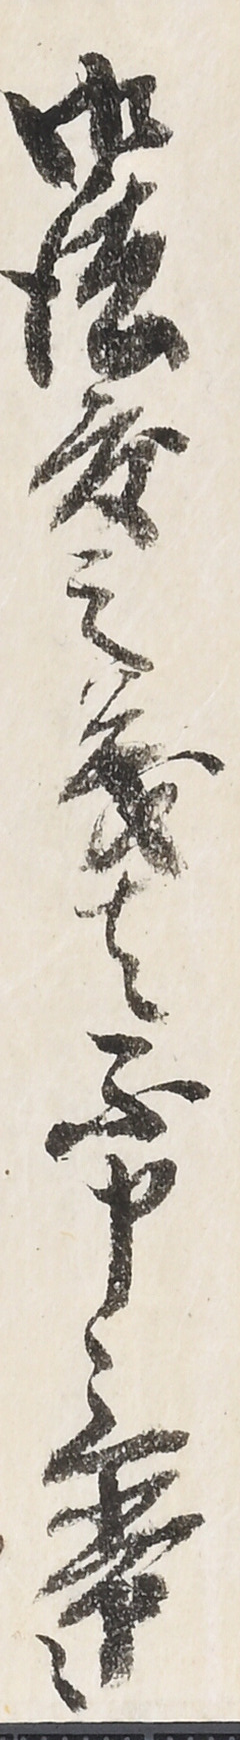御法度之義者不申上常々
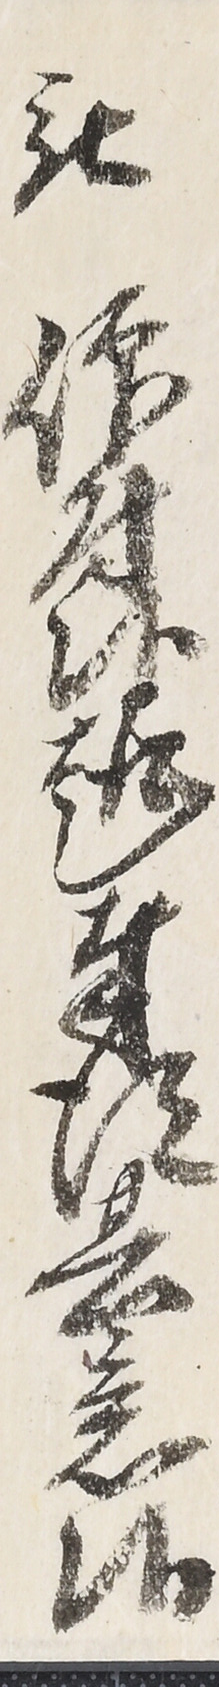被仰付候趣奉得其意候
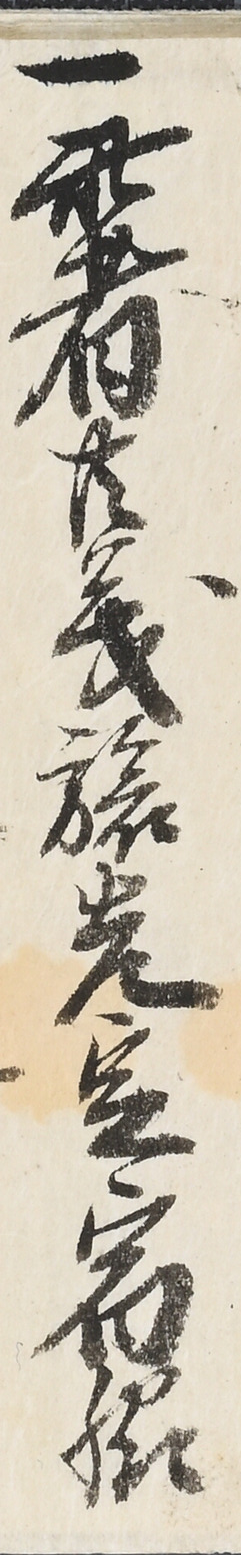一此者共義旅先定宿脇
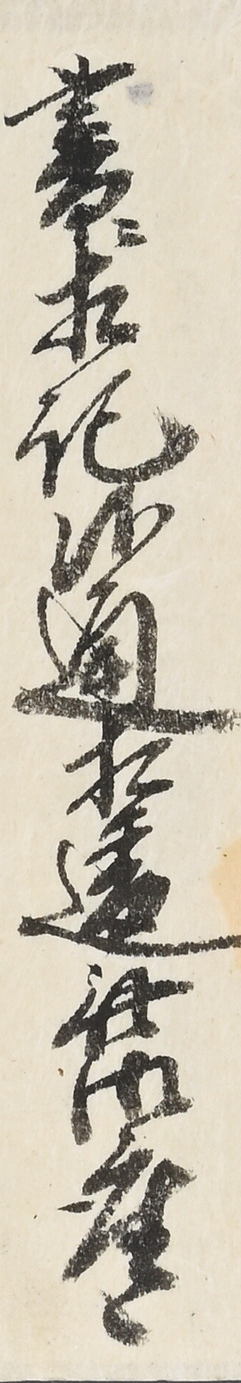書ニ相記候通相違無御座候
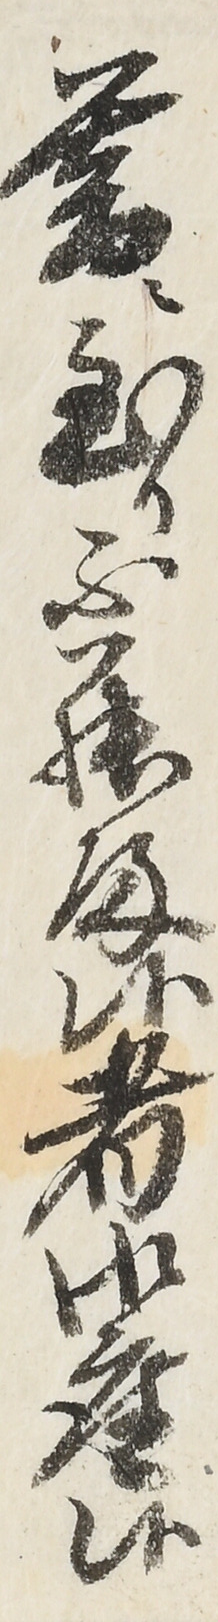暮ニ至り不罷帰候者御座候
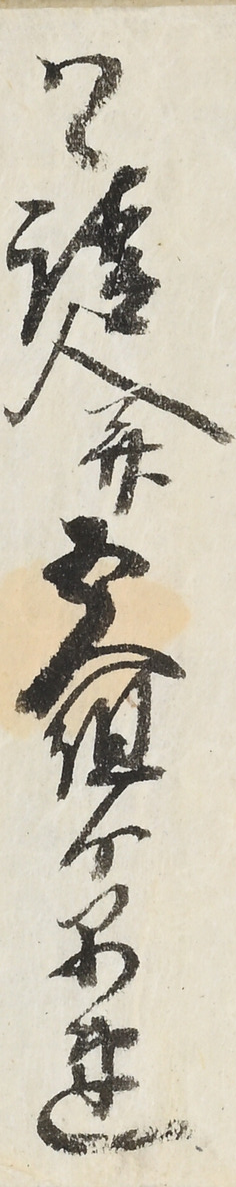ハヽ請人幷五人組ゟ早速

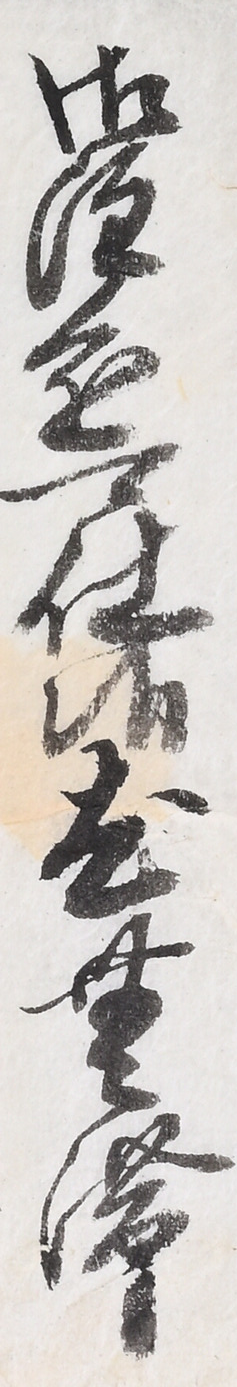御注進可仕候尤無滞
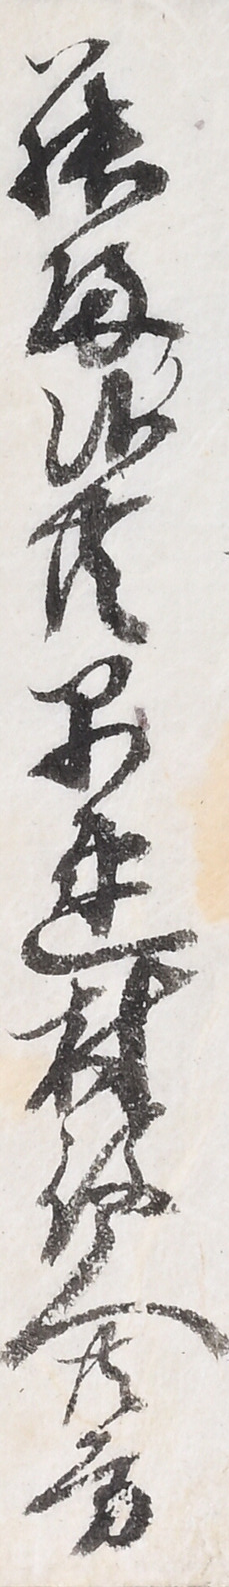罷帰り候共早速村役人供方
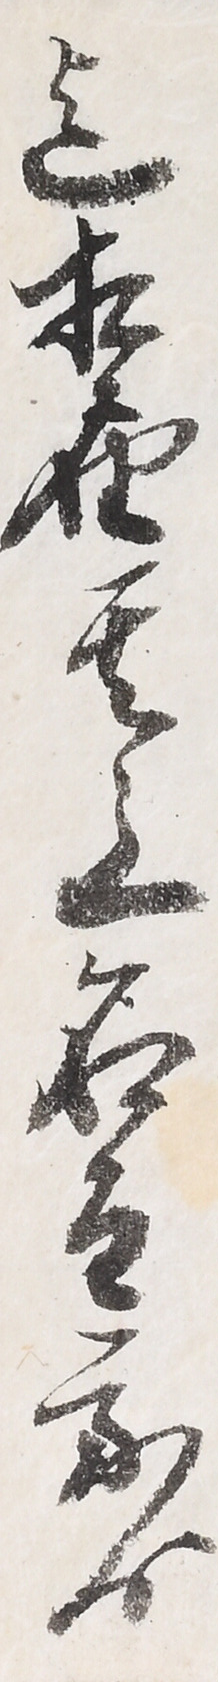迄相届其上名主方ゟ
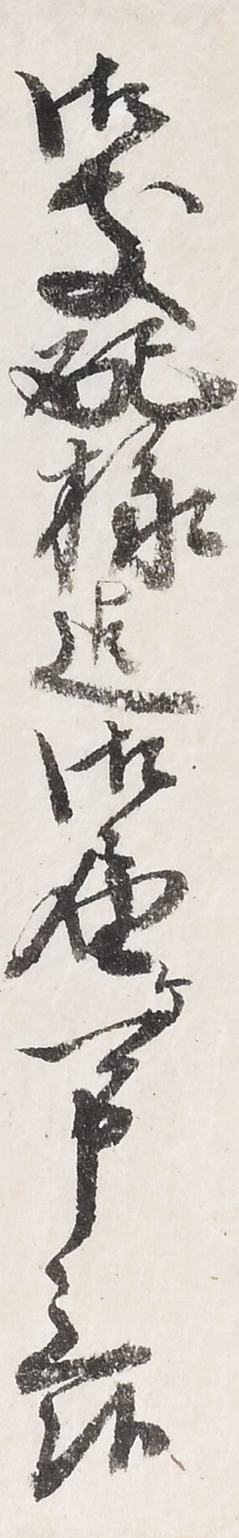御支配様迄御届ケ可申上候
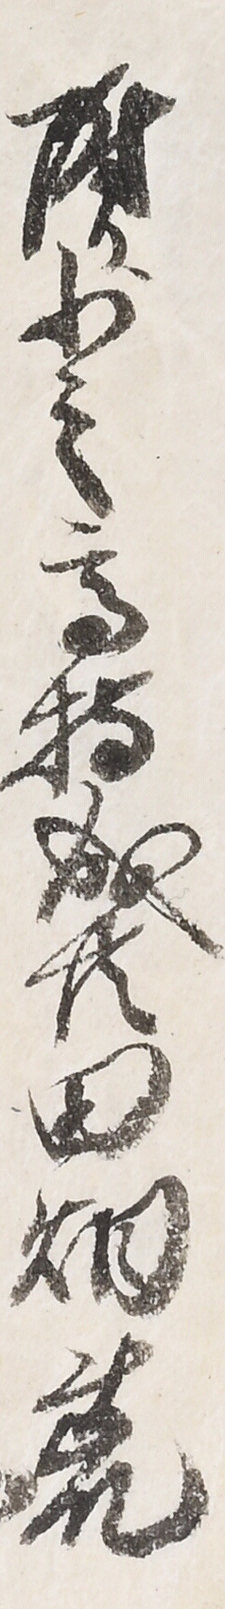附り、小之高持成共田畑荒
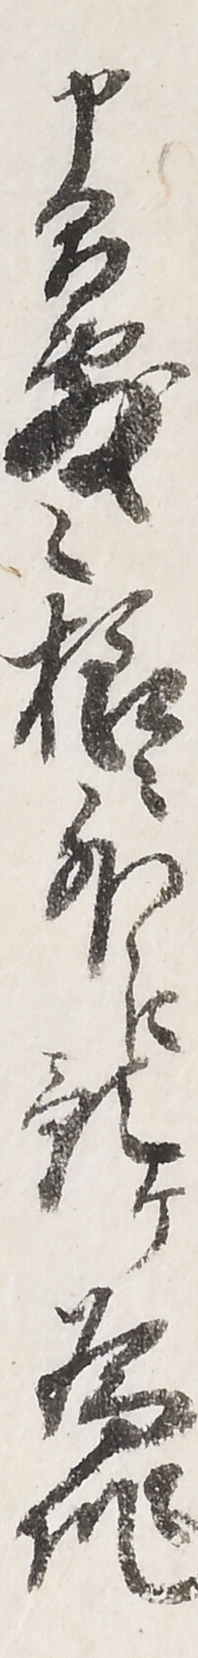申間敷候様ニ外江預ヶ為作
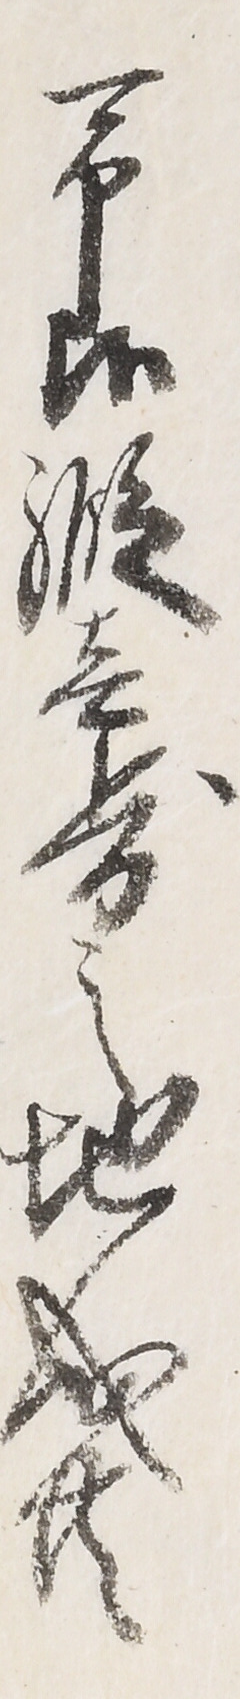可申候縦壱歩之地成共
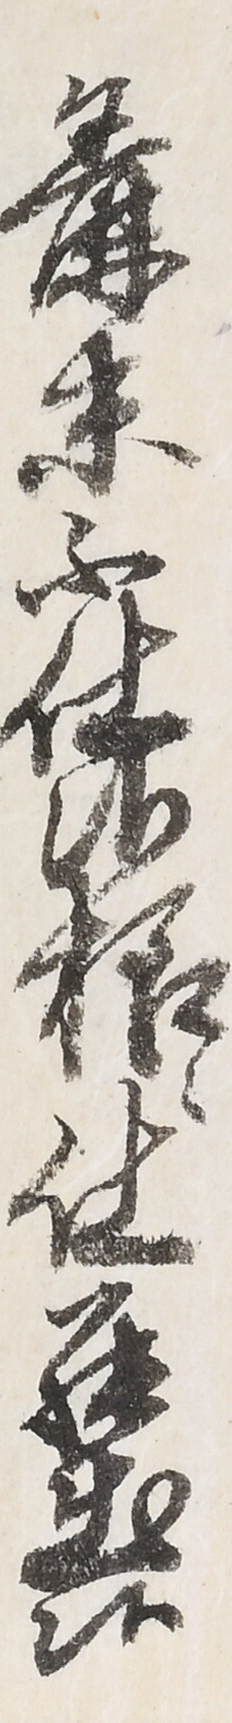麤末不仕候様ニ仕罷出候
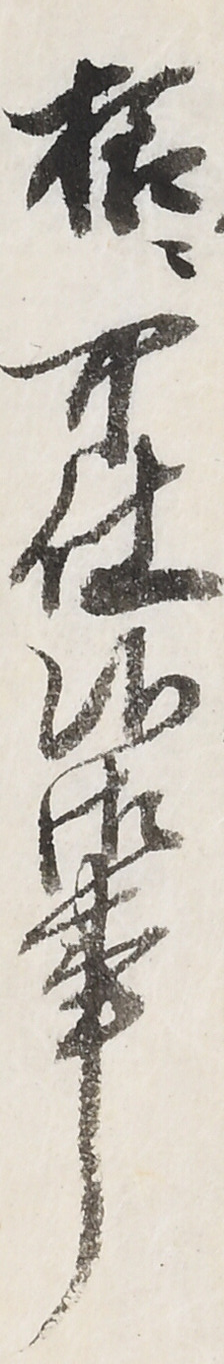様ニ申仕候御事
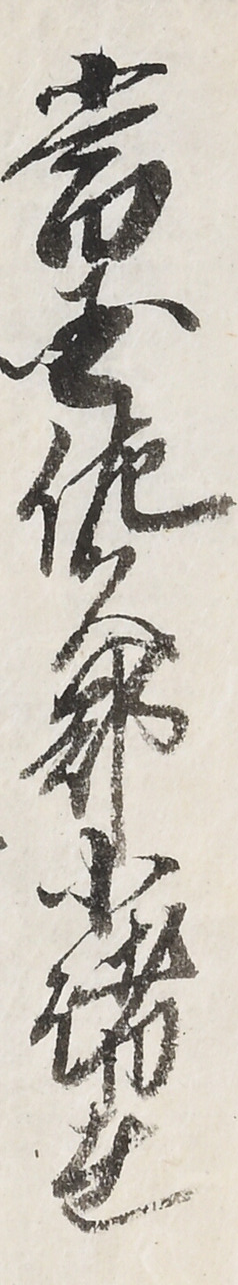当国佐久郡小諸在
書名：安政七庚申年正月石切旅稼名前書上帳
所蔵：伊那市立高遠町図書館・合同会社AMANE
